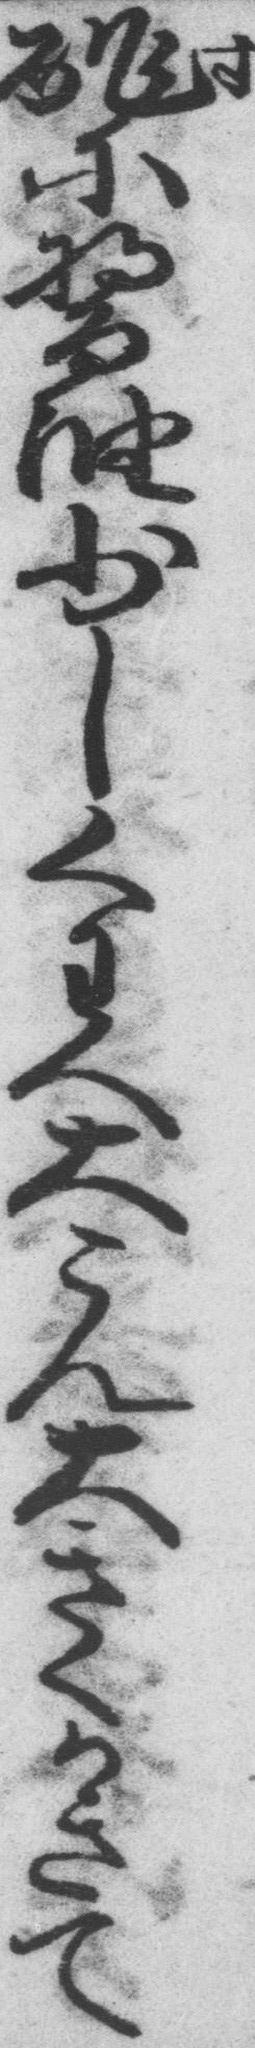酢に醤油少しくわへ大こん大きくかきて
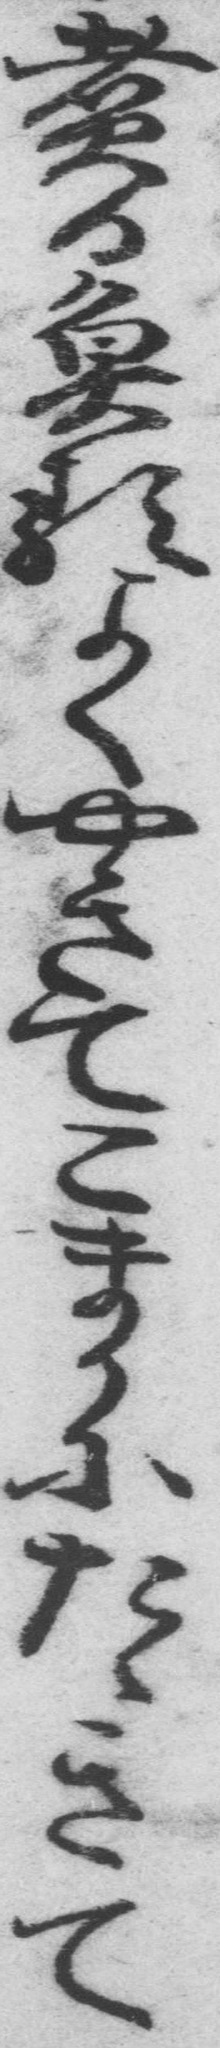煮る魚類よくやきてこまかにたゝきて
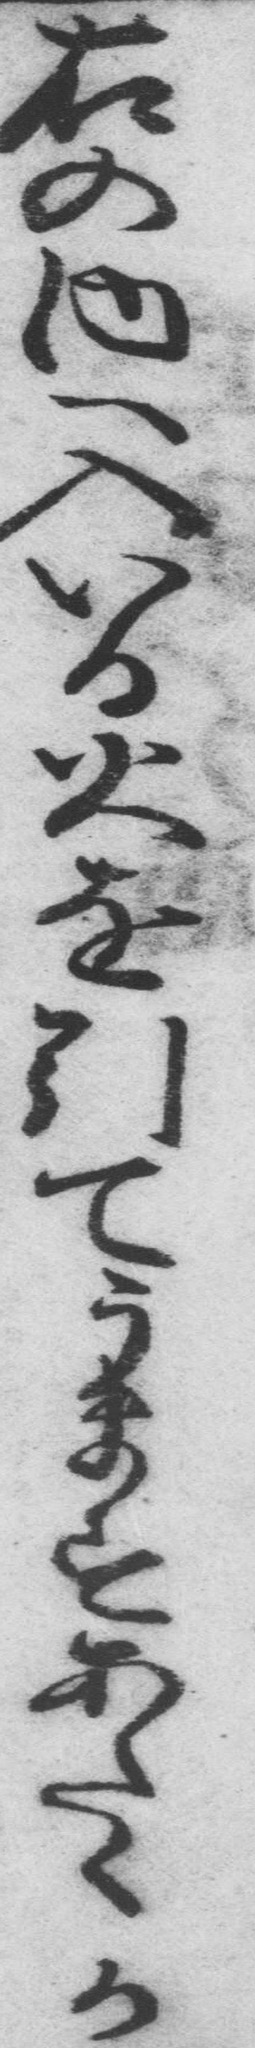右の内へ入いる火を引てうますあたゝか
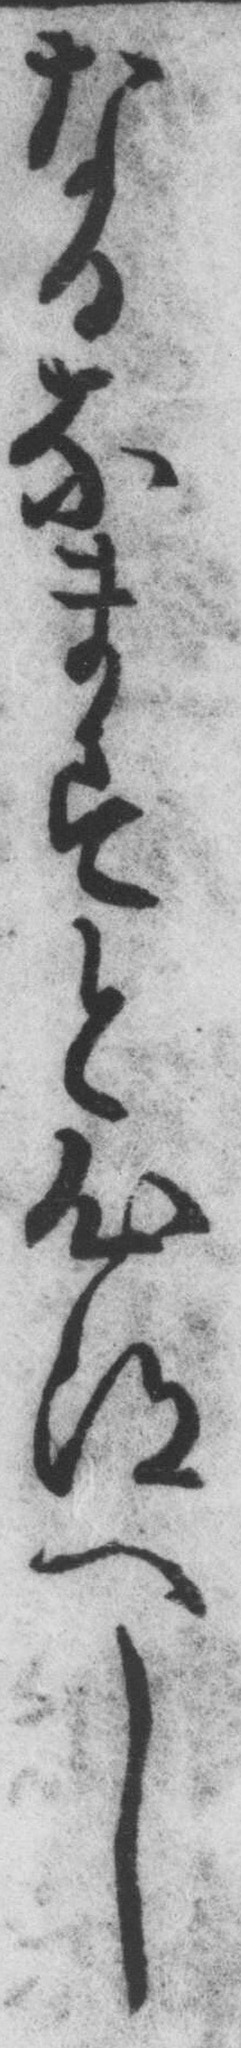なるなますとこ心得へし
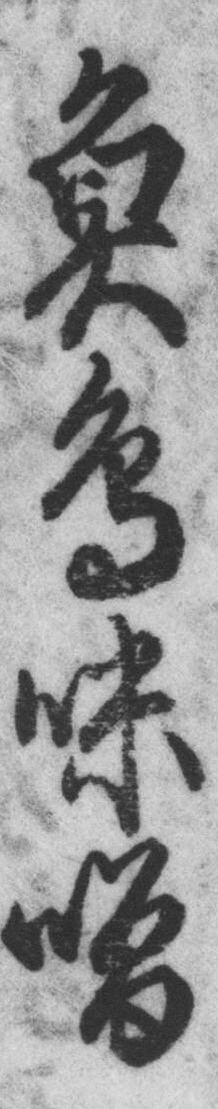魚鳥味噌
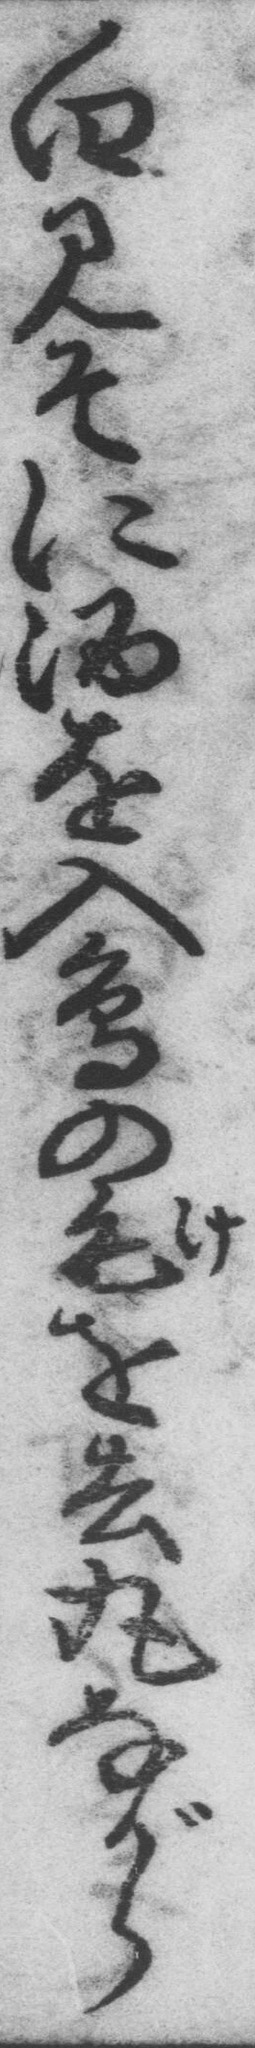白みそに酒を入鳥の毛を去丸ながら

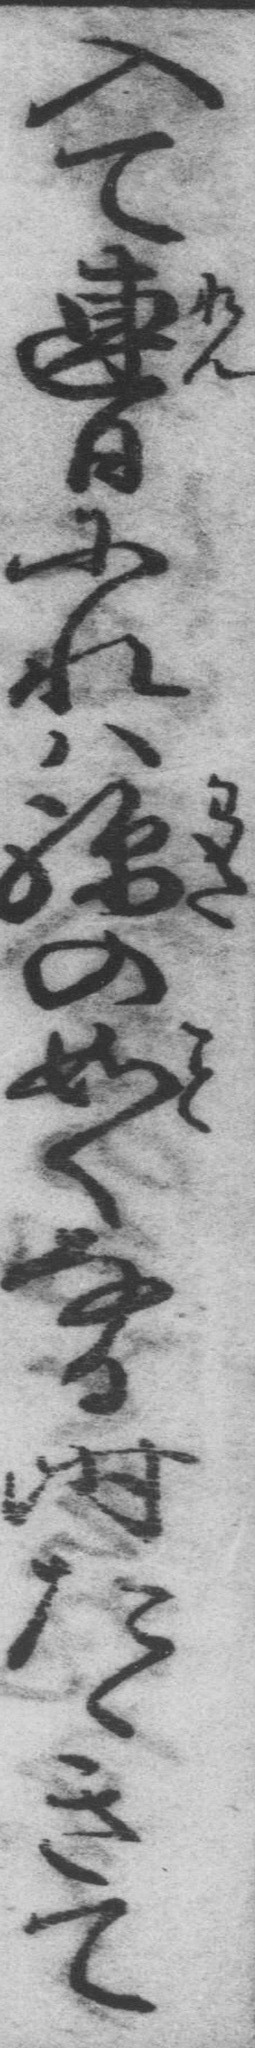入て連日にれは綿の如くなる時たゝきて
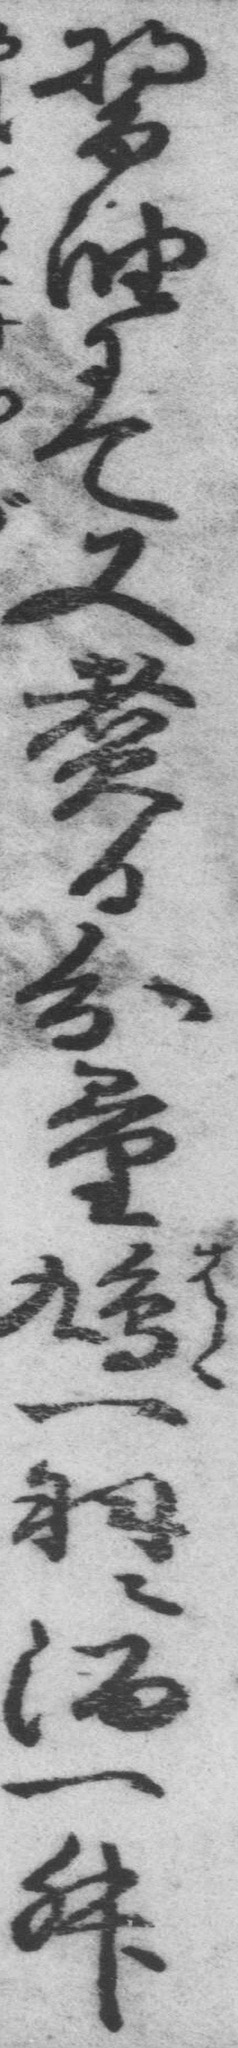醤油にて又煮る分量鳩一羽に酒一升
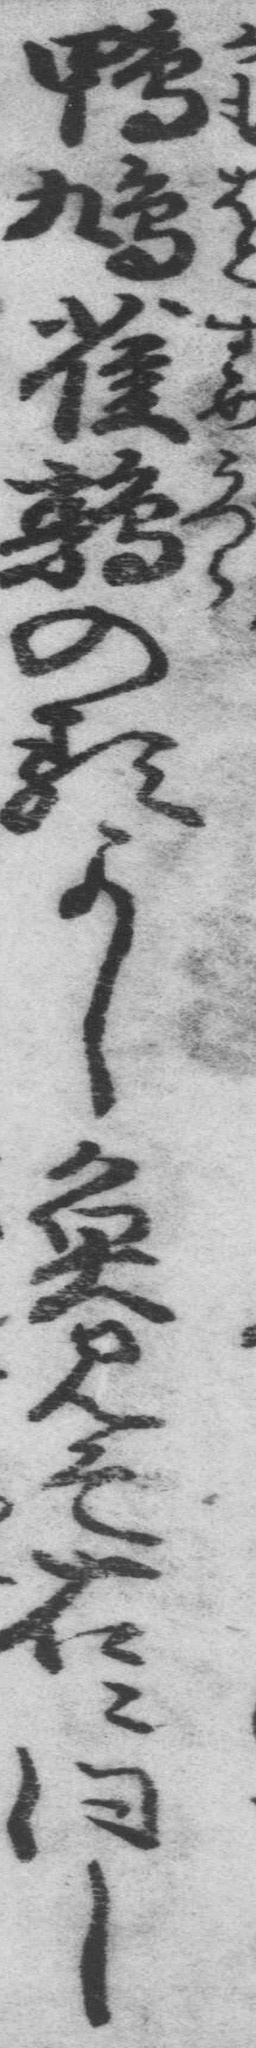鴨鳩雀鶉の類よし魚みそ右に同し
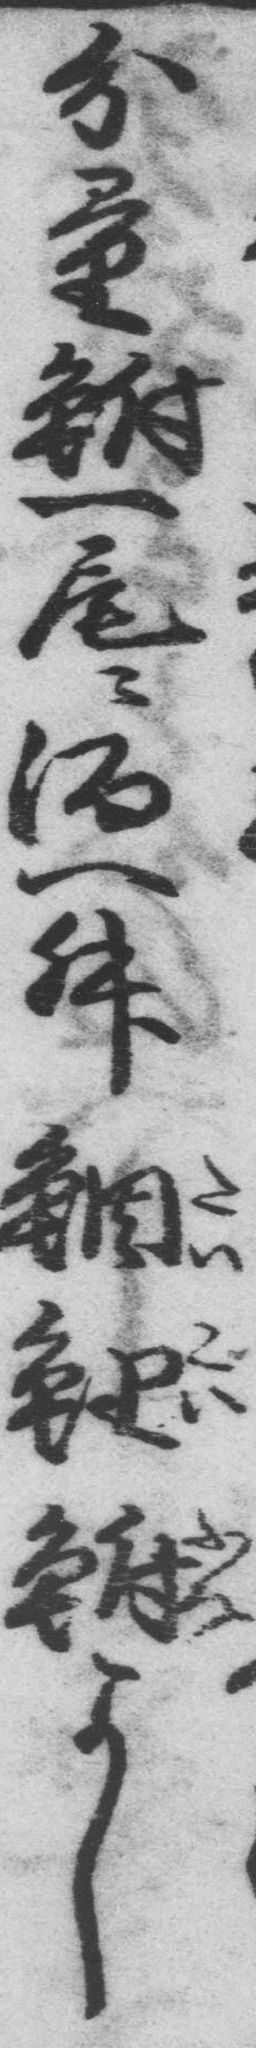分量鮒一尾に酒一升鯛鯉鮒よし
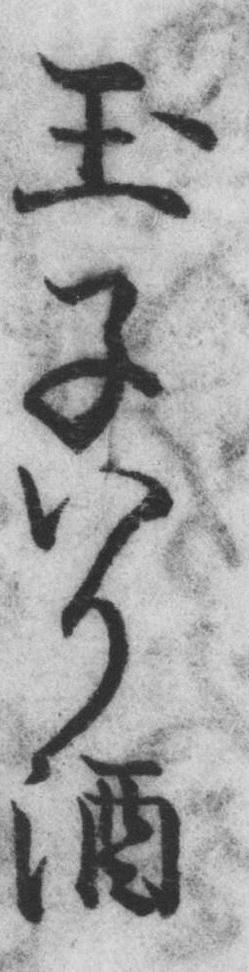玉子いり酒
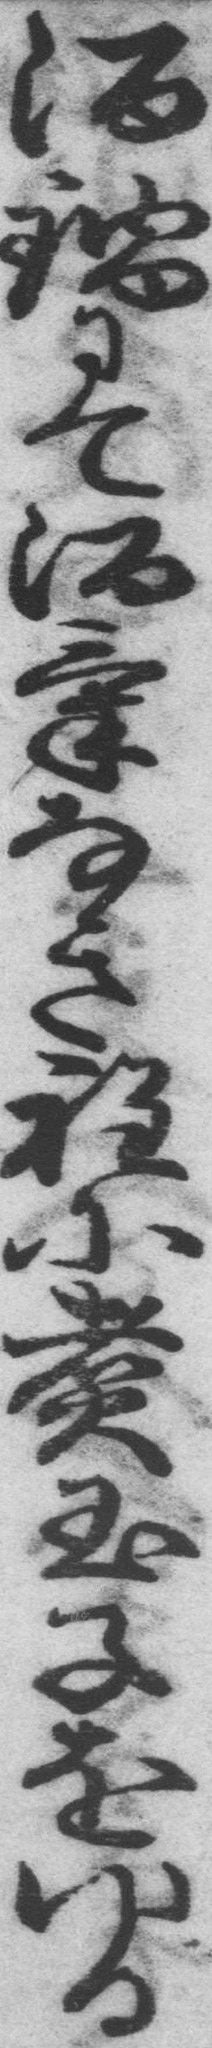酒鍋にて酒気なき程に煮玉子をゆる
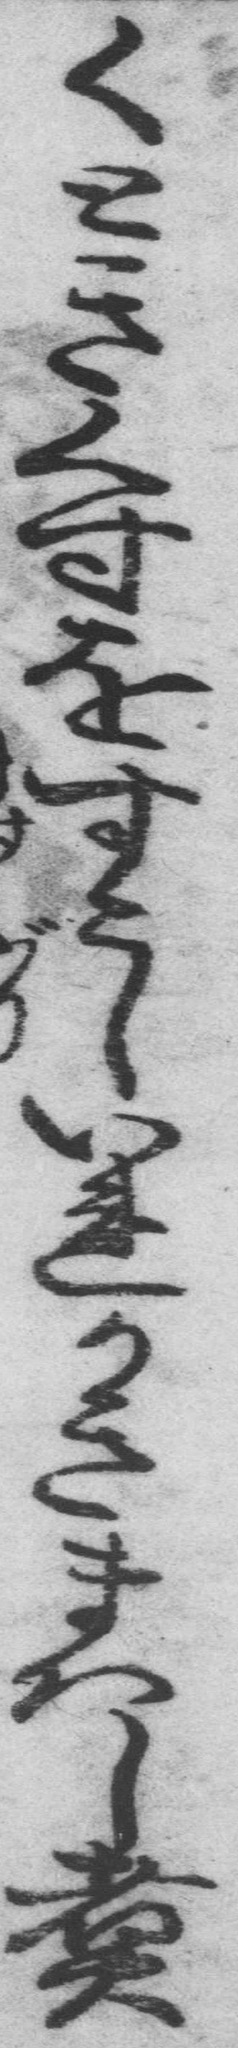くときくすをすこしいれかきまはし煮
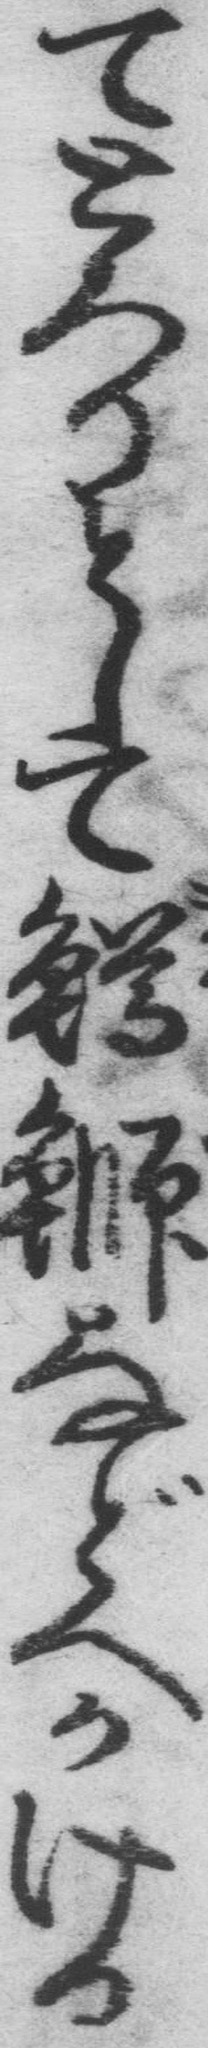てとろりとして鱒鰤などへかける
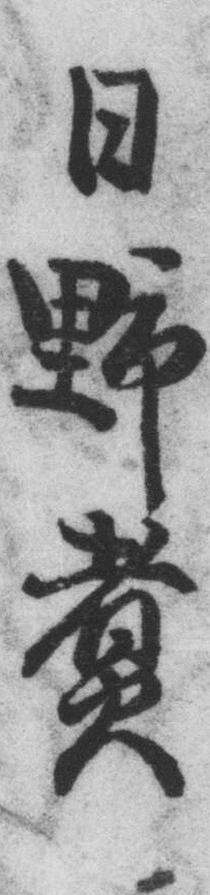日野煮
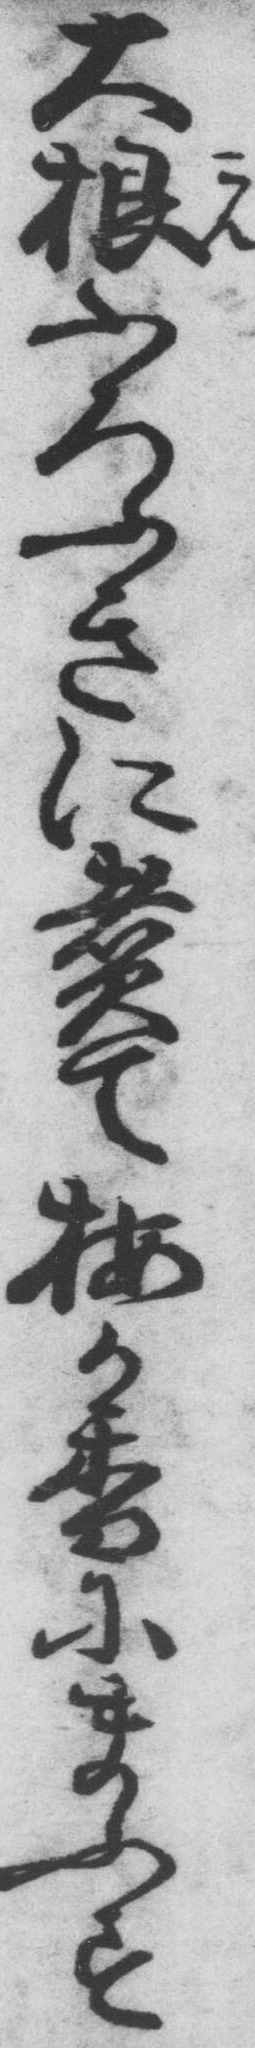大根ふろふきに煮て梅か香にまふす
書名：料理山海郷
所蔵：大阪府立大学学術情報センター 国文学研究資料館
